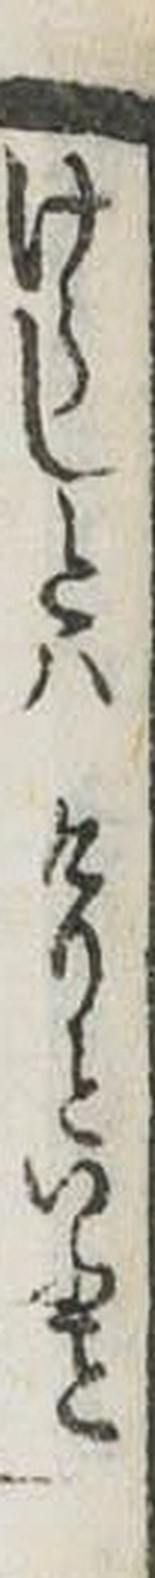けらしとはけりといふこと
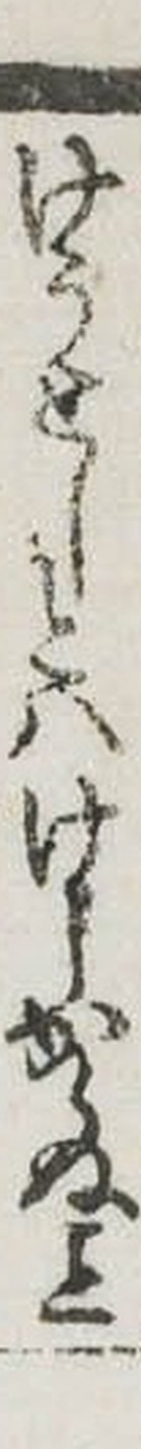けうとしとはけしからぬこと
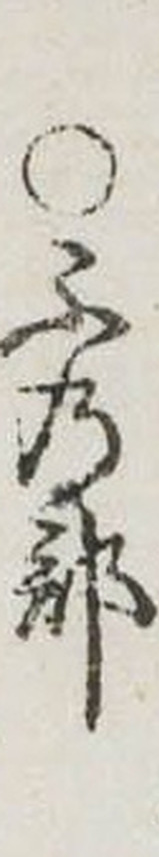○ふの部
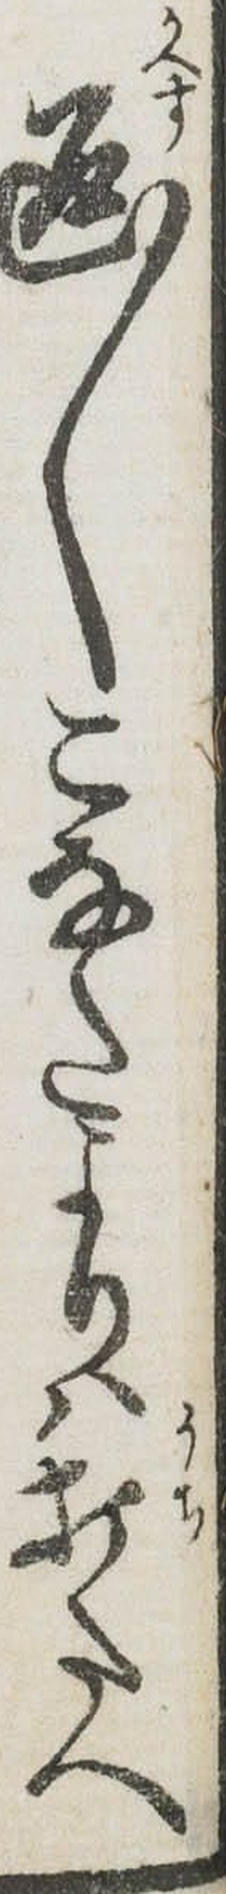返〳〵こなたよりは打たへ
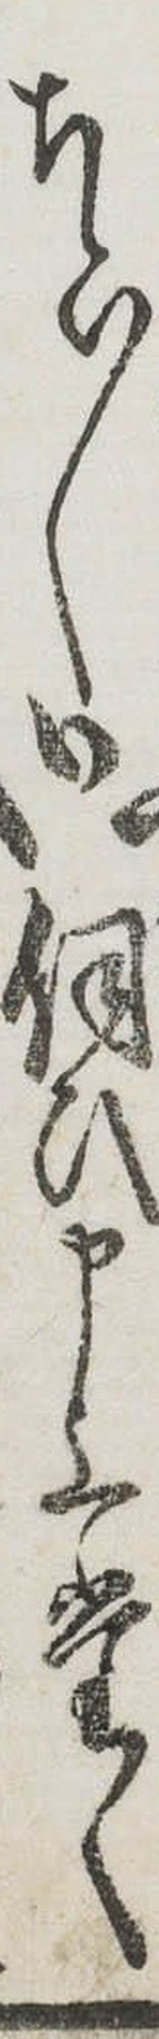ちと〳〵御伺ひ申上たく
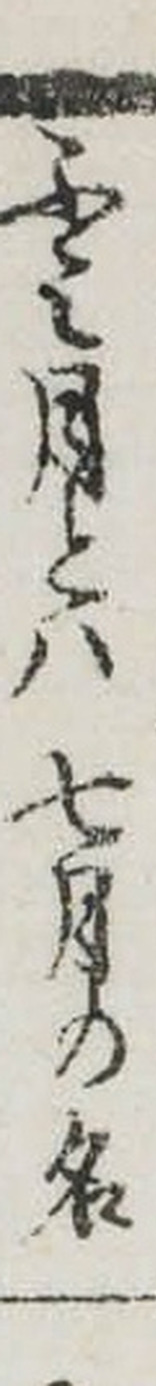ふみ月とは七月の名
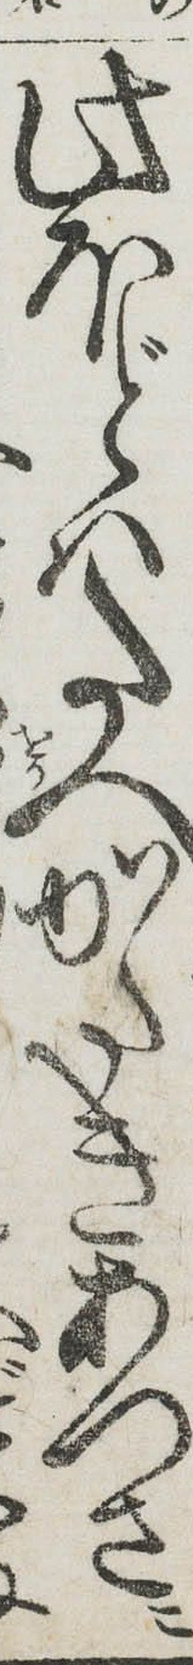此ほどはたへかたきあつさに
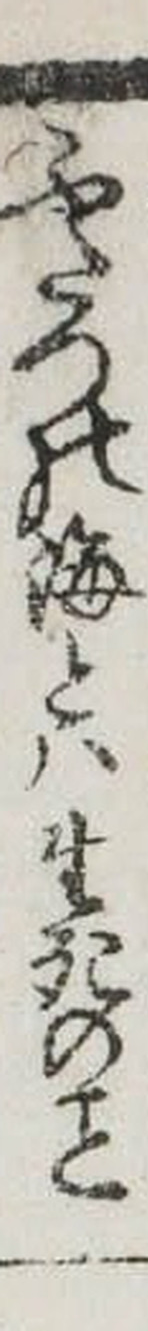ふたつの海とは生死のこと
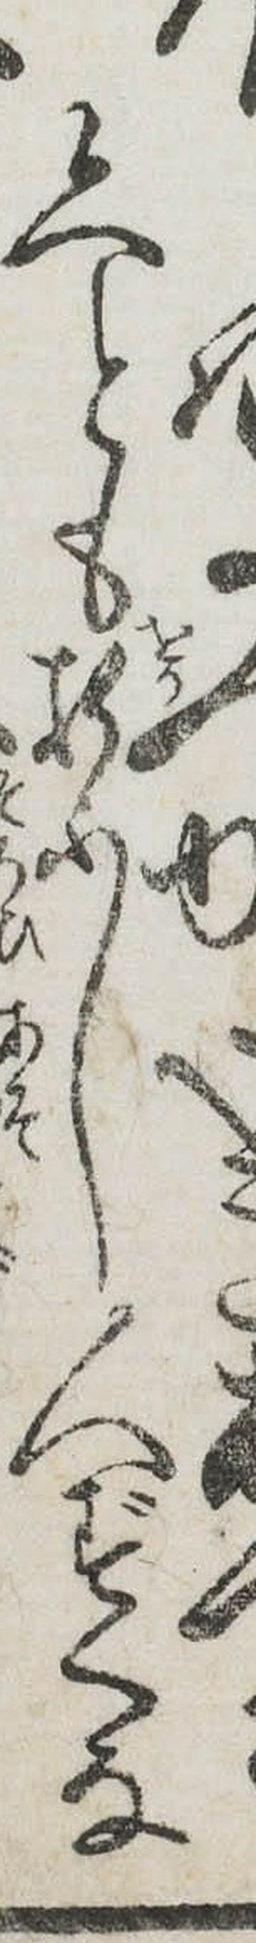候へとも折ふし人ずくな
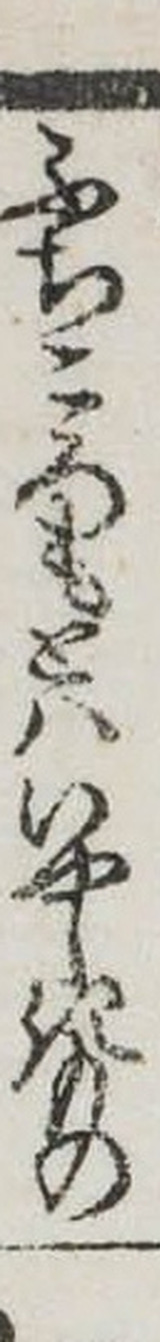ふちころもとはいやしきもの
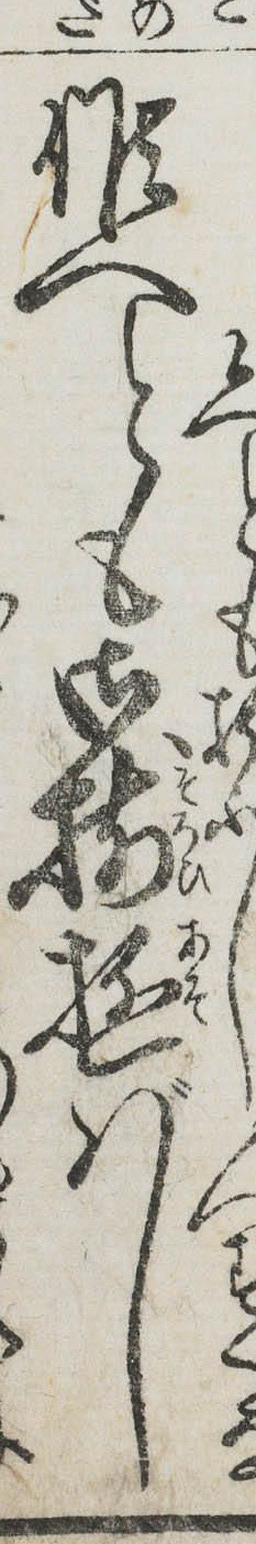候へとも御揃遊ばし
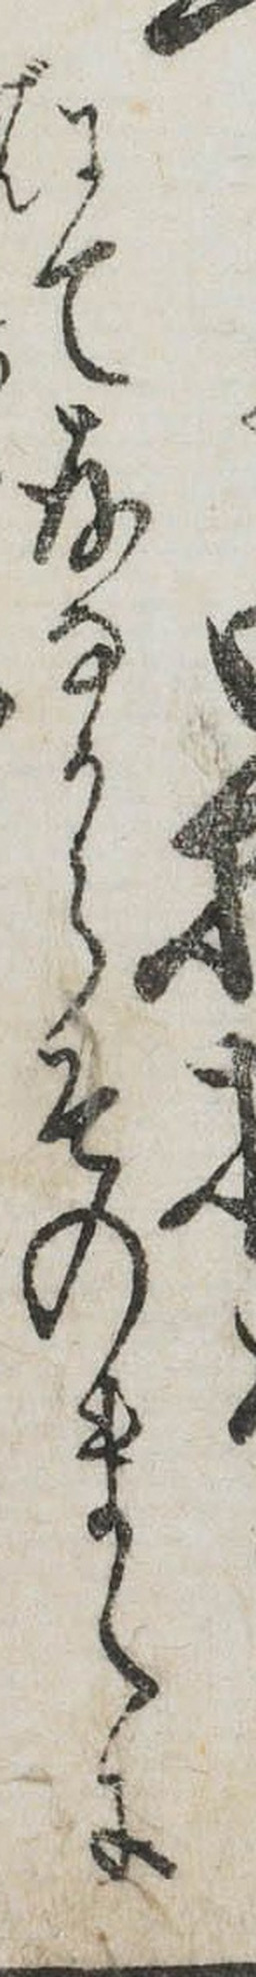にて存なからそのまゝに
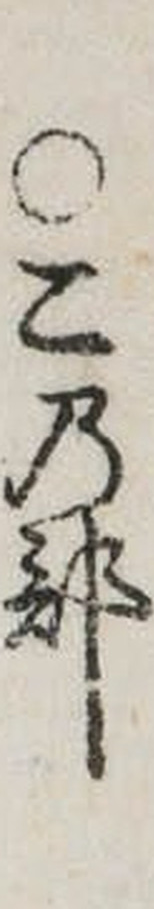○この部
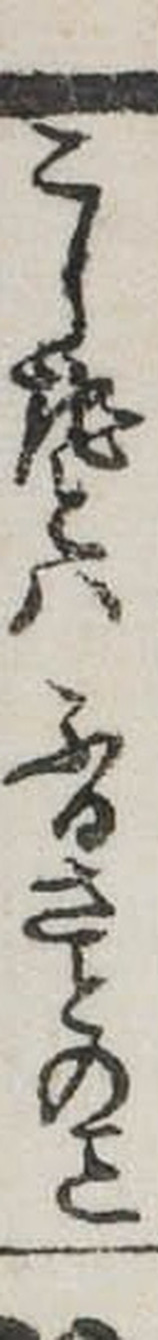こし地とはふるさとのこと
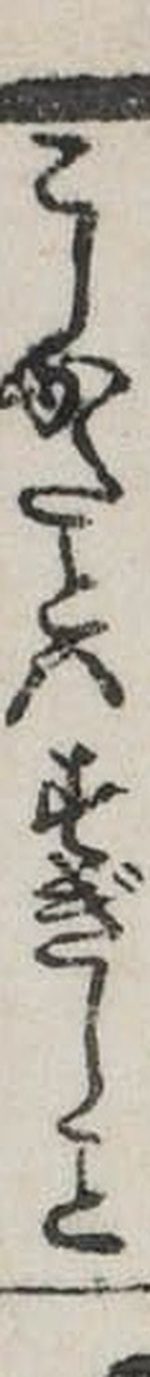こしかたとはすぎしこと
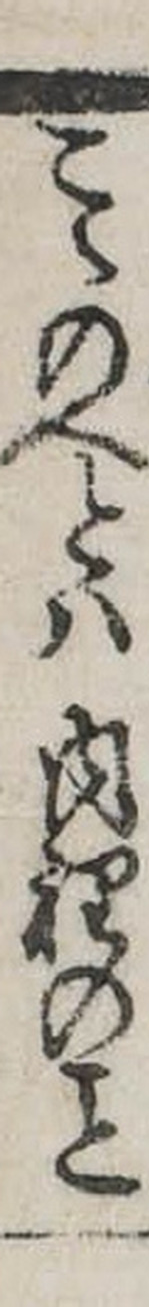こゝのへとは内裡のこと
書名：頭書萬用婦人手紙之文言
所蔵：東京学芸大学教育コンテンツアーカイブ
